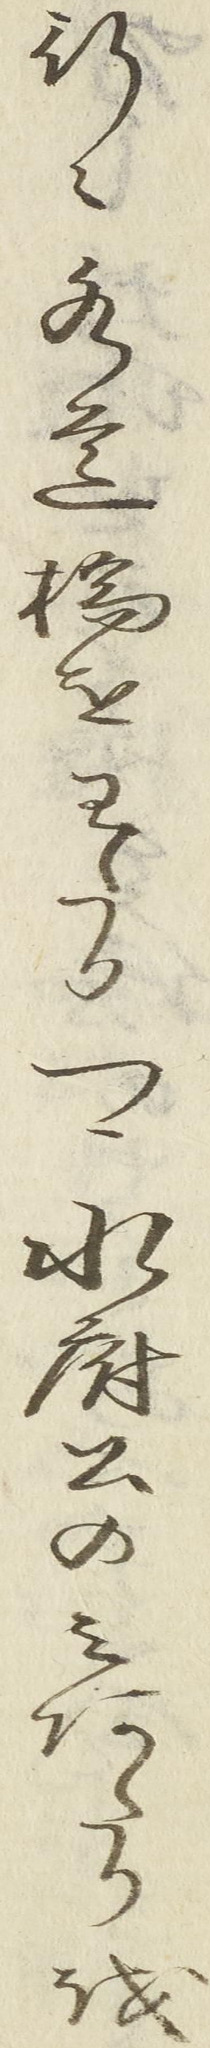行〻水道橋をわたりつゝ水府公のみあたりを
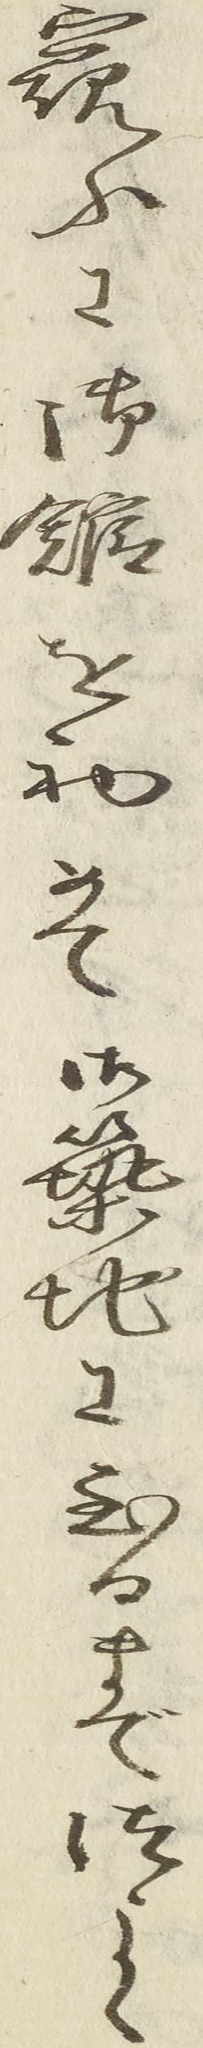窺ふに御館を初めて御築地に至るまでつよく
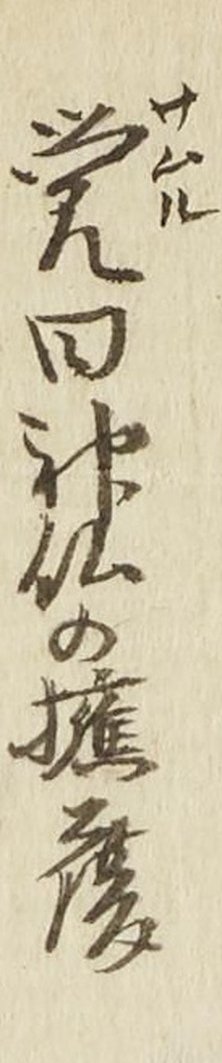覚曰神仏の擁？護
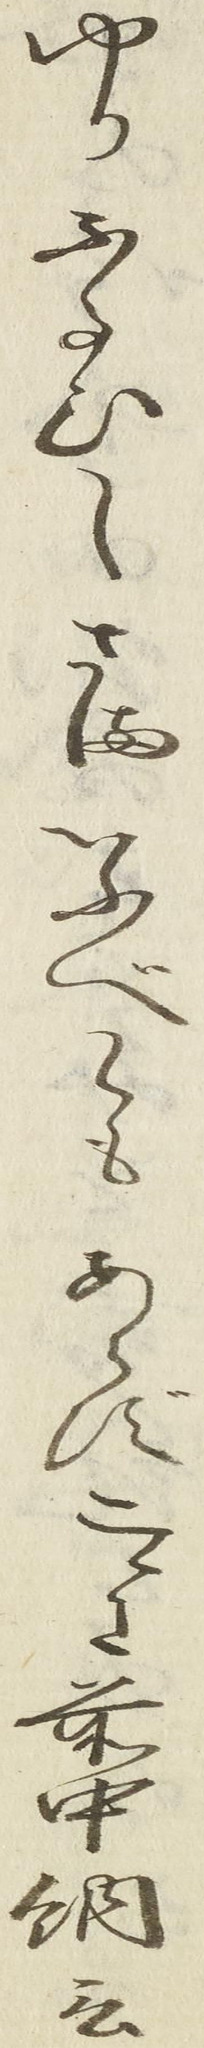ゆりふるひしさまいふべくもあらずこゝに前中納言
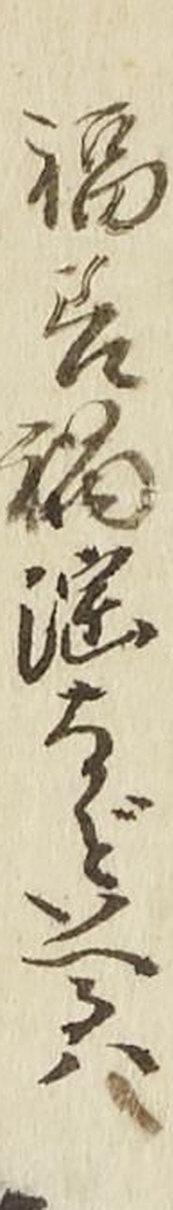福善禍淫なといへるは
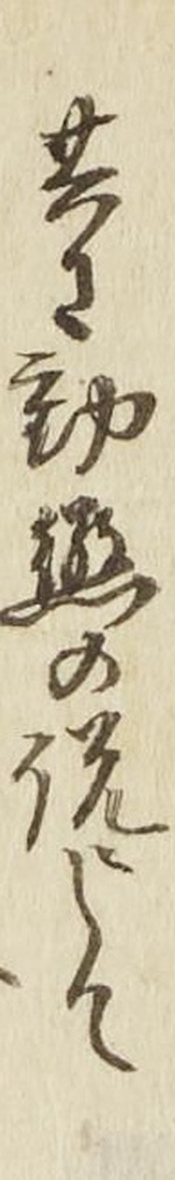共に勧懲の説にして
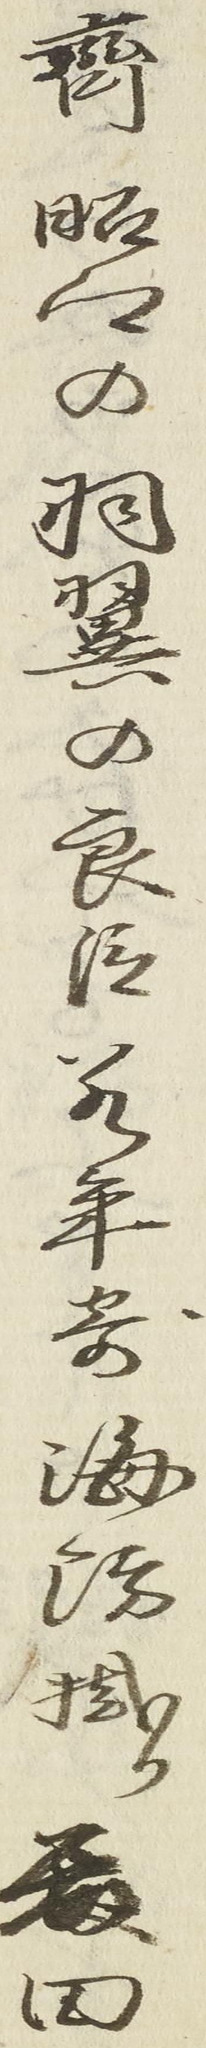斉昭卿の羽翼の良臣前年寄海防掛り藤田
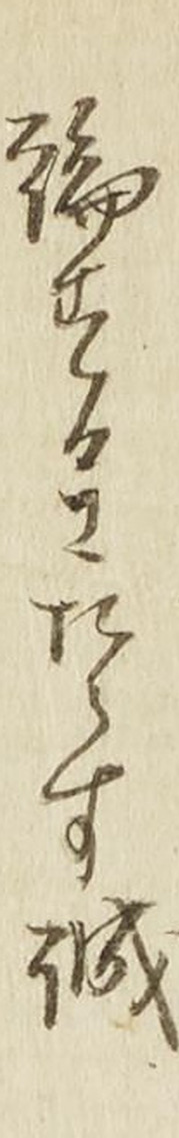論するにたらす誠
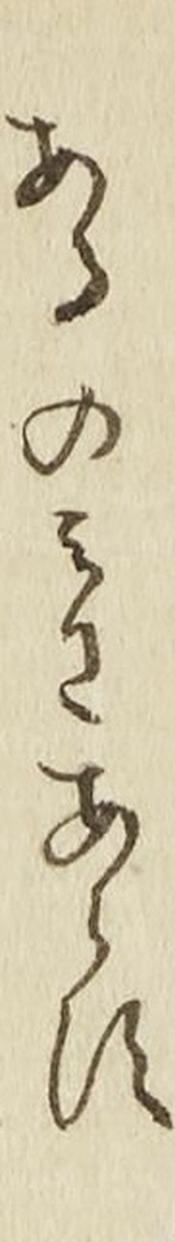あるのみにあらす
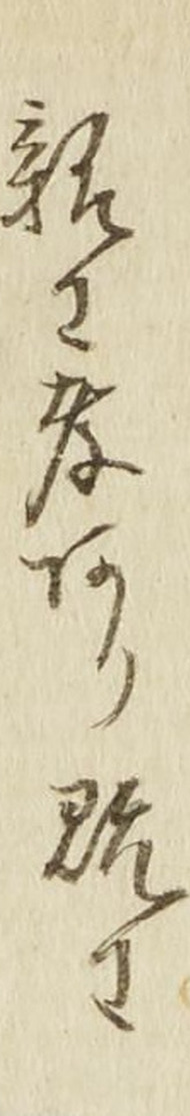親に孝あり既に
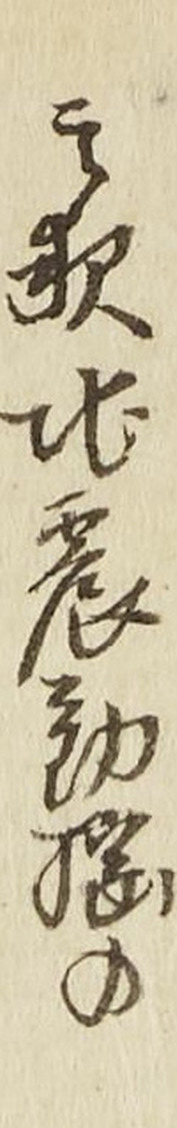其夜地震動揺の
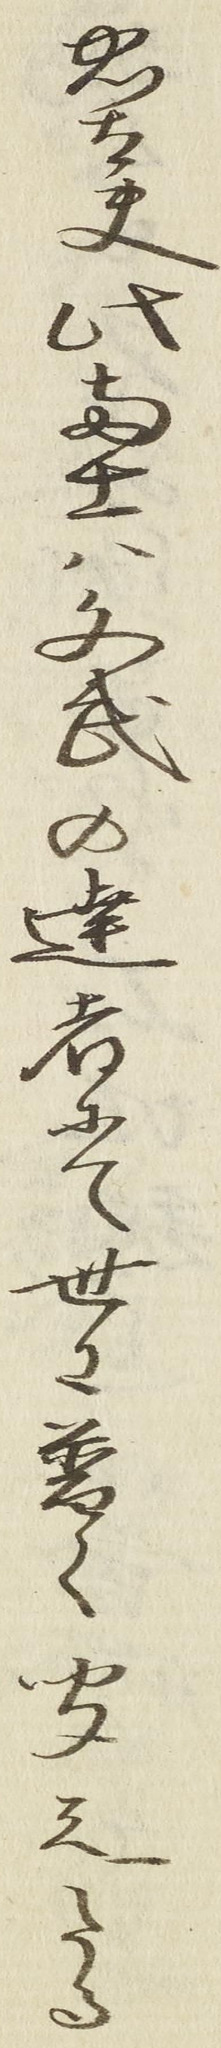忠太夫此両士は文武の達者にて世に普く聞えたる
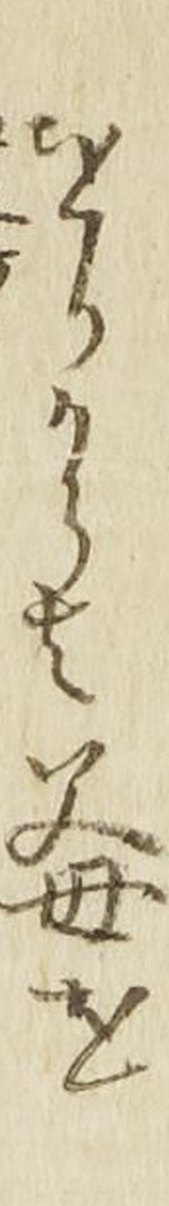をりからは父母を
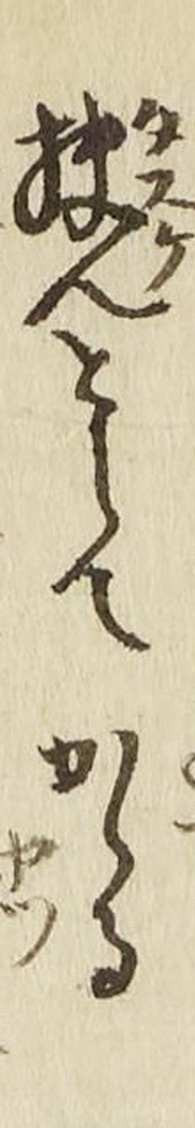扶んとしてかゝる
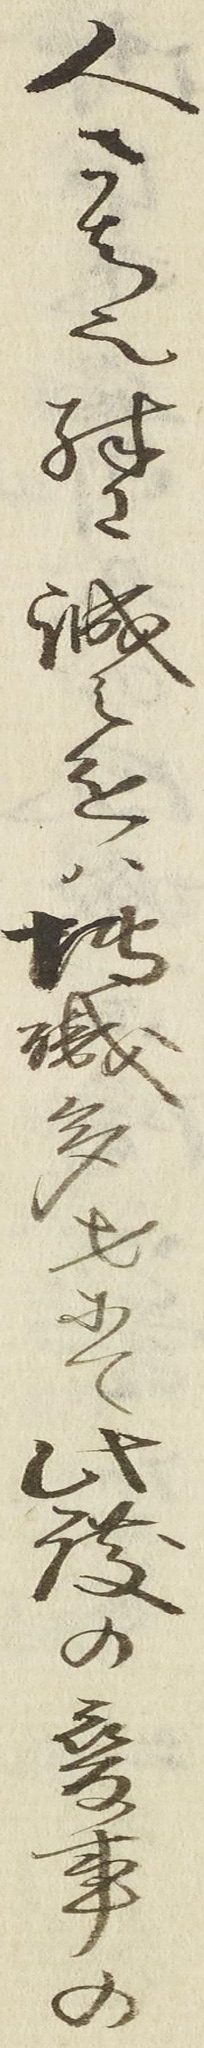人たち也殊に誠之進は博識多才にて此度の変事の
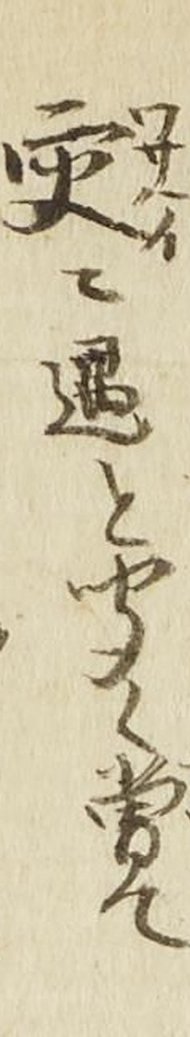災に遇と聞く嘗て
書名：やぶれ窓の記　全
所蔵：東京大学地震研究所図書室 Earthquake Research Institute Library, The University of Tokyo, JAPAN
